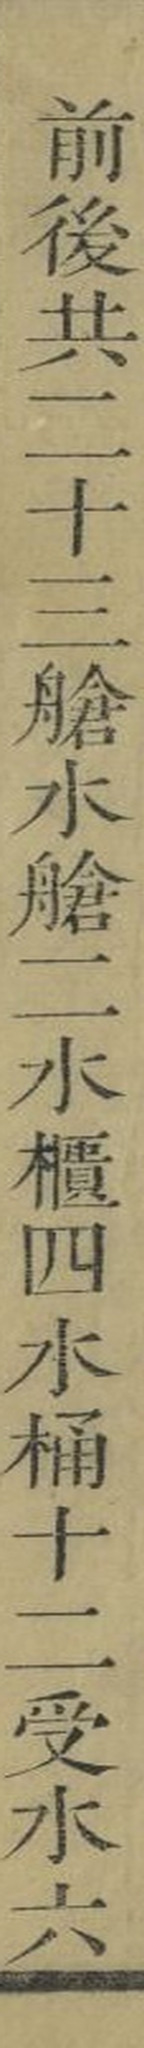前後共二十三艙水艙二水櫃四水桶十二受水六
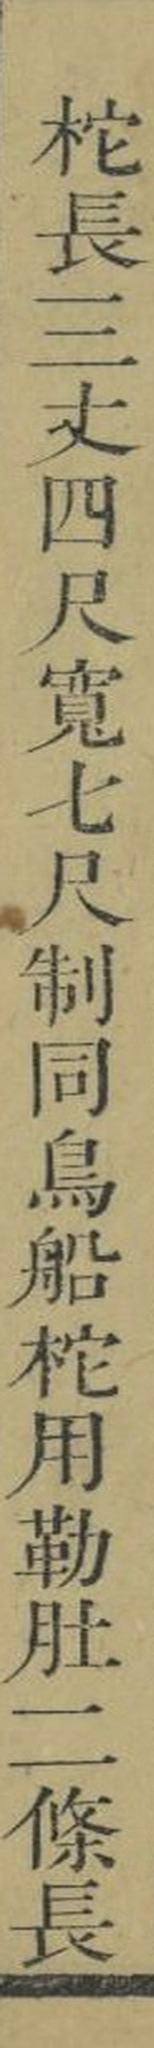柁長三丈四尺寬七尺制同鳥船柁用勒肚二條長
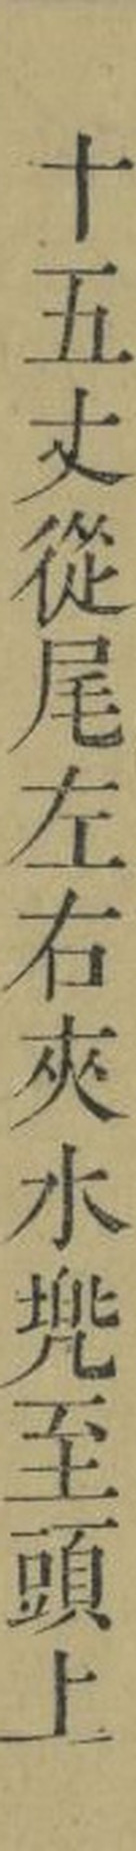十五丈從尾左右夾水兠至頭上
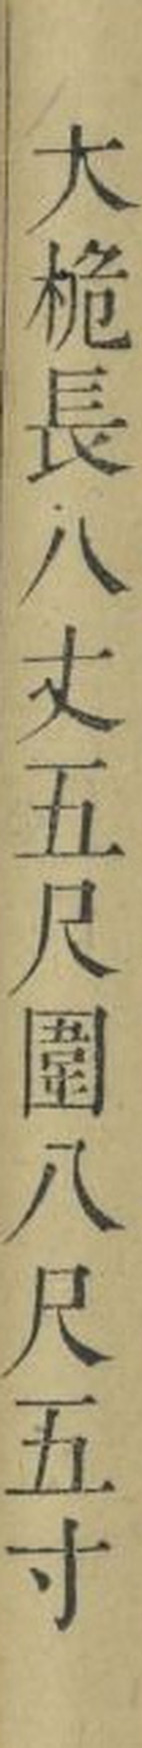大桅長八丈五尺圍八尺五寸
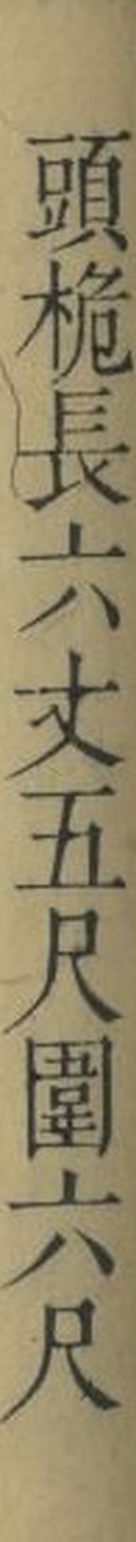頭桅長六丈五尺圍六尺
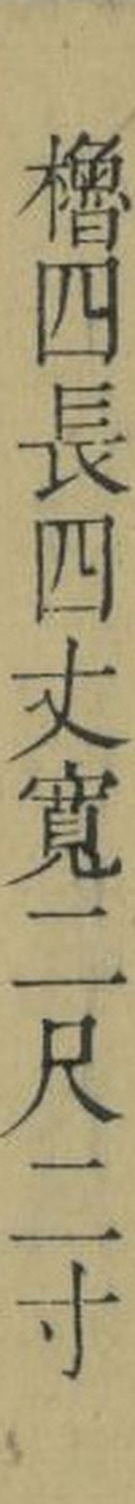櫓四長四丈寬二尺二寸
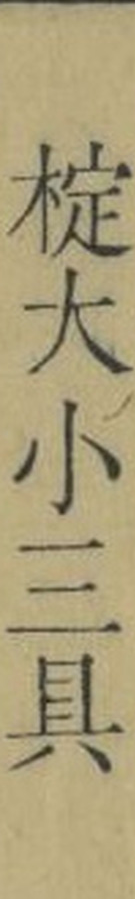椗大小三具
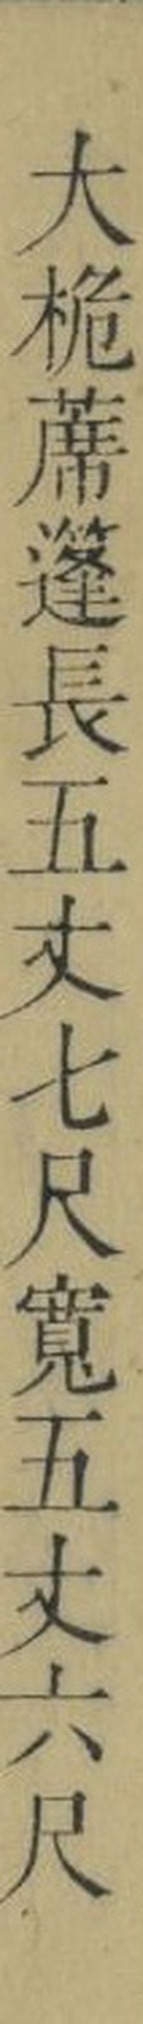頭桅蓆篷長五丈七尺寬五丈六尺
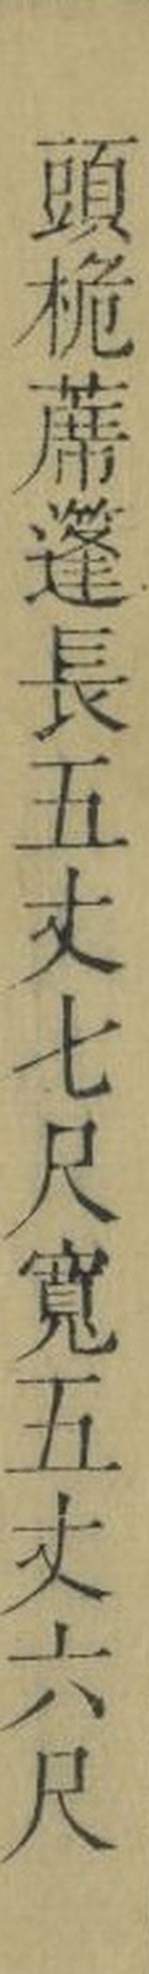頭桅蓆篷長五丈七尺寬五丈六尺
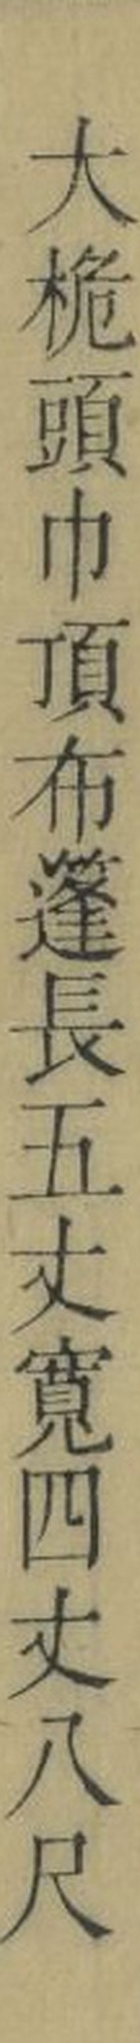大桅頭巾頂布篷長五丈寬四丈八尺
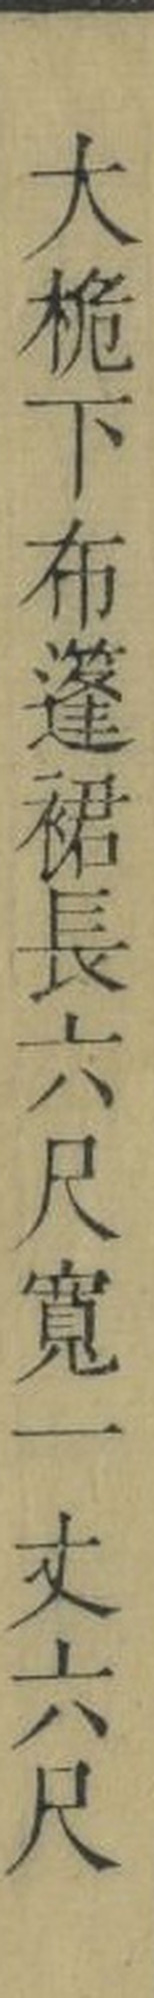大桅下布篷裙長六尺寬一丈六尺
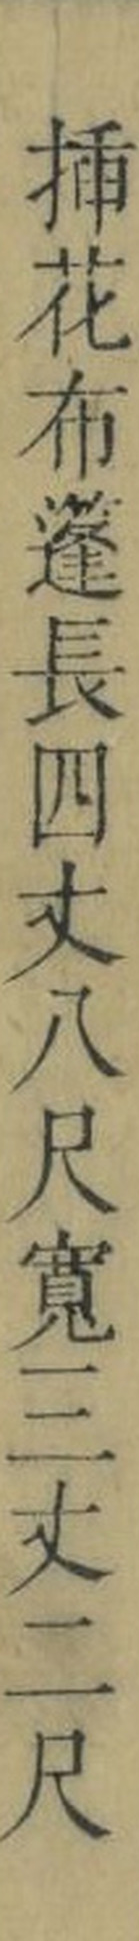揷花布篷長四丈八尺寬三丈二尺
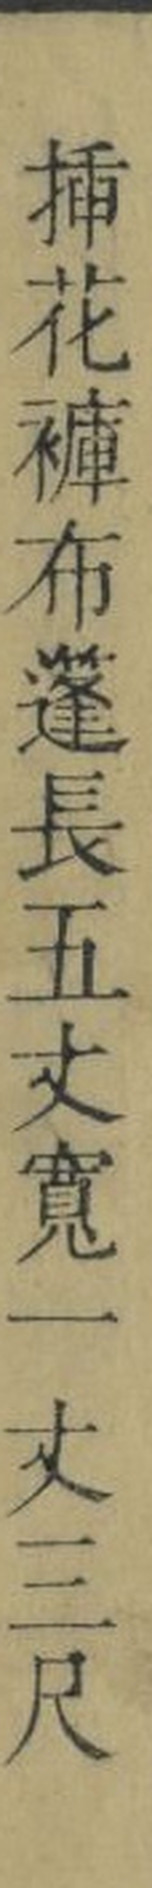揷花褲布篷長五丈寬一丈三尺

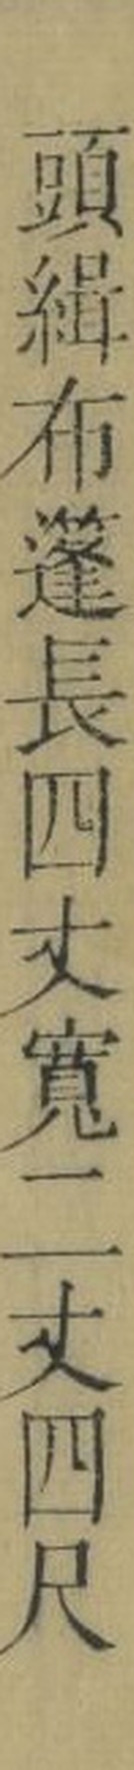頭緝布篷長四丈寬二丈四尺
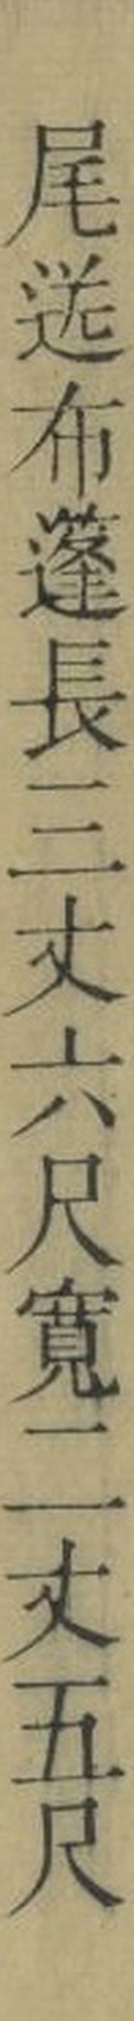尾送布篷長三丈六尺寬二丈五尺
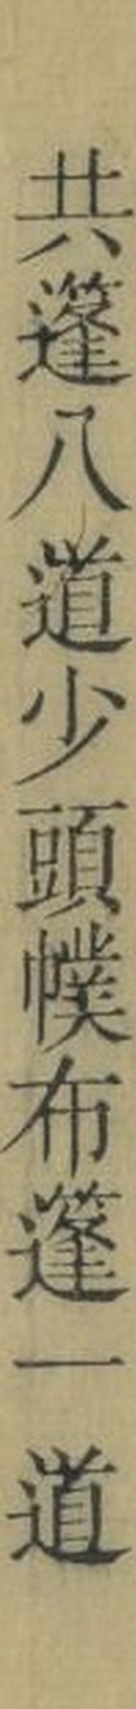共篷八道少頭幞布篷一道
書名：中山伝信録 巻一
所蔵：University of the Ryukyus Library
